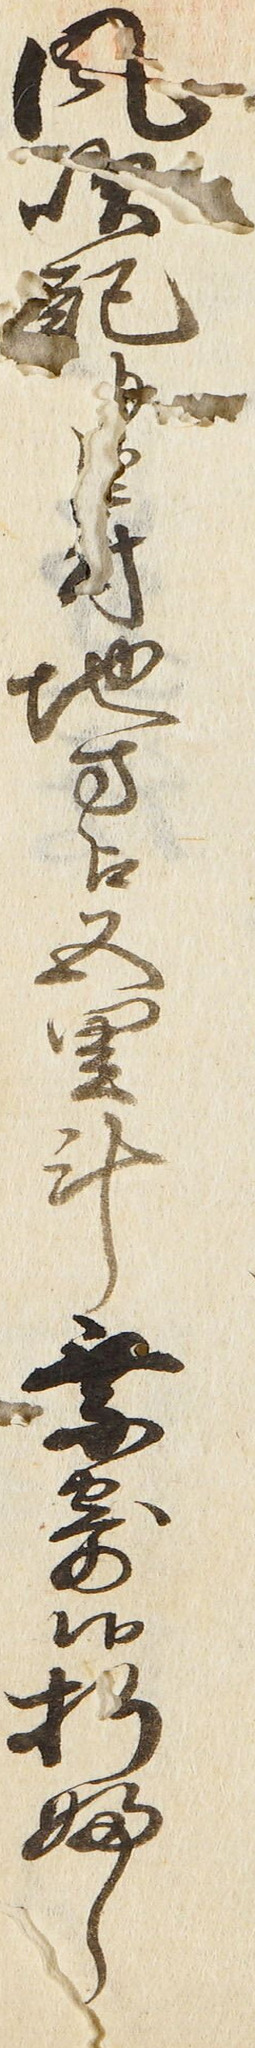風吹配り候ニ付地方江五里斗乗寄候折ふし
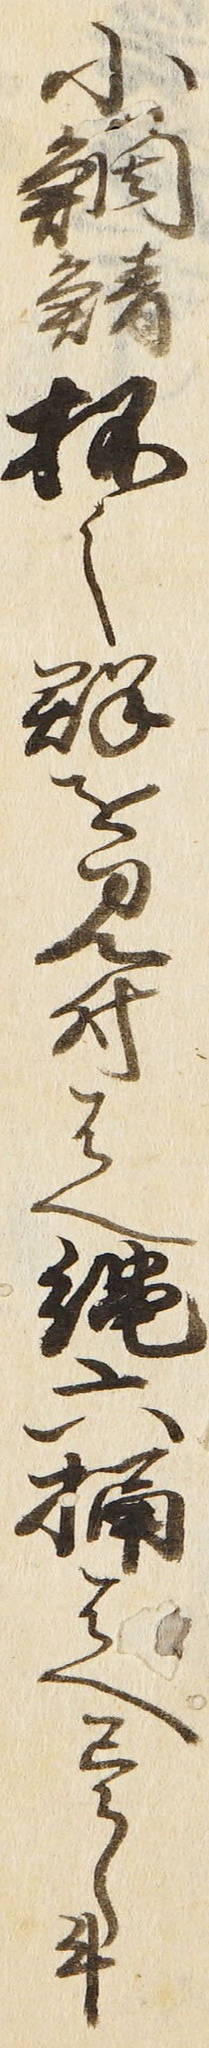小鯛鯖抔之群を見付はへ縄六桶はへ尽し午
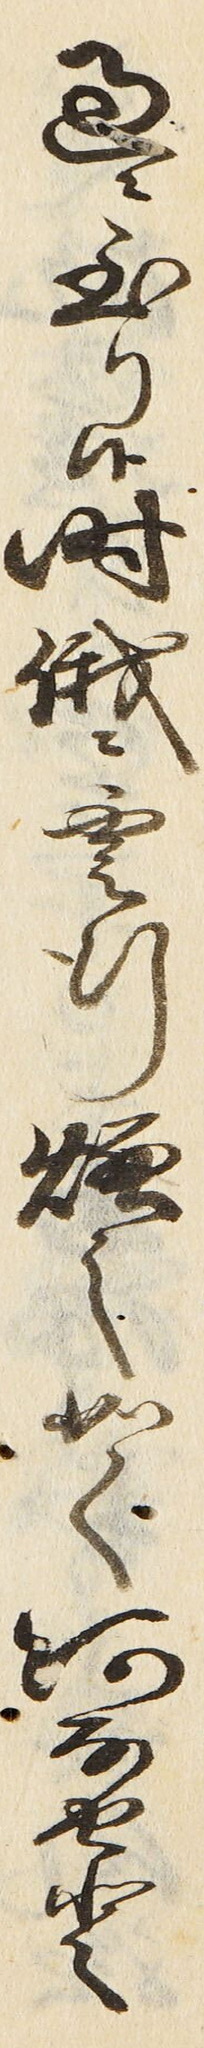過二至り候時俄ニ雲行煙之如くあなせと
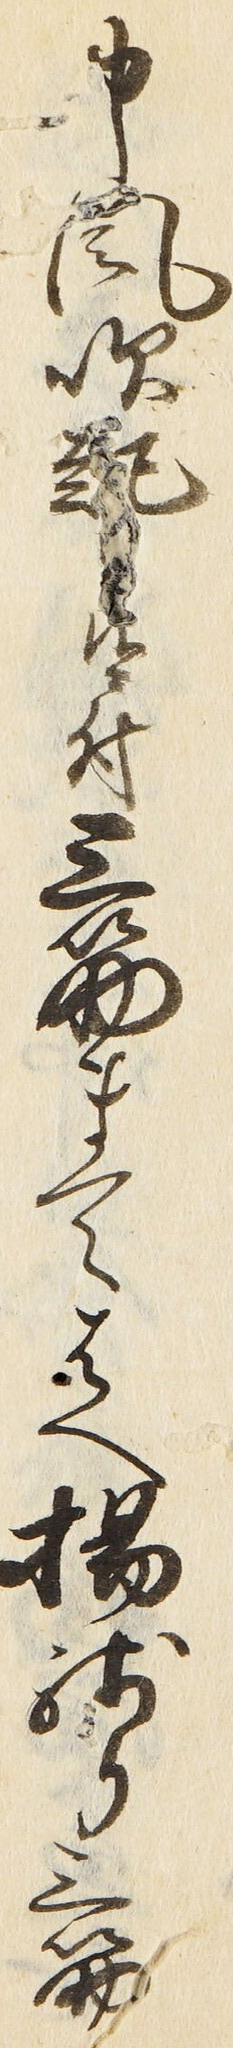申風吹起り候ニ付三筋まてはへ揚残り三筋
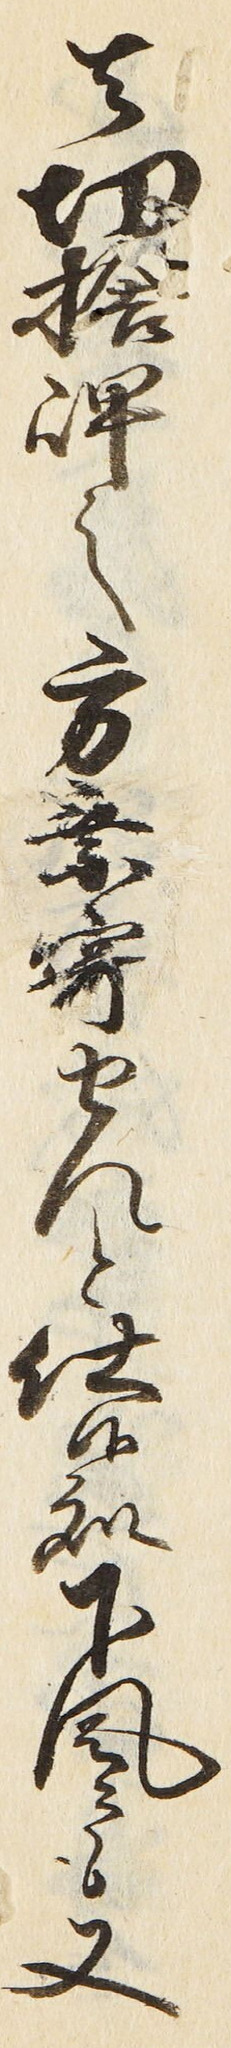者切捨岬之方乗寄せんと仕候処下風も又
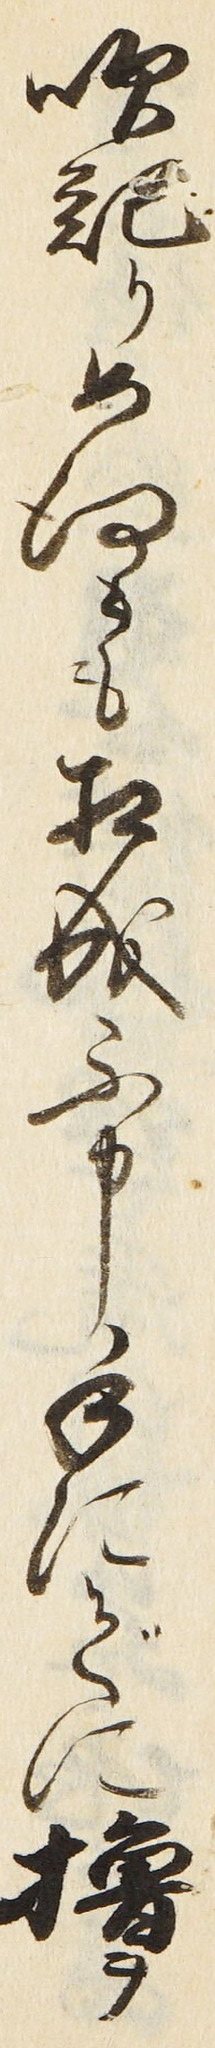吹起り如何とも相成不申手にでに櫓ヲ
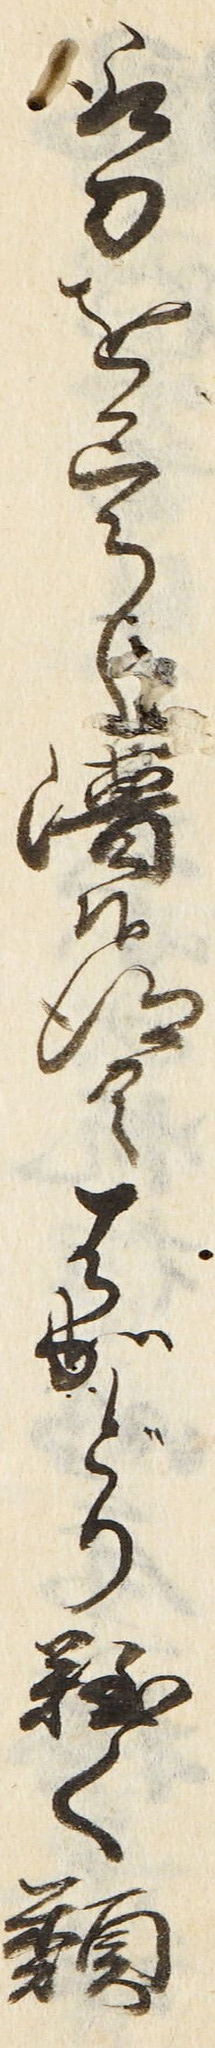取力を盡し漕候得共はかどり難く類
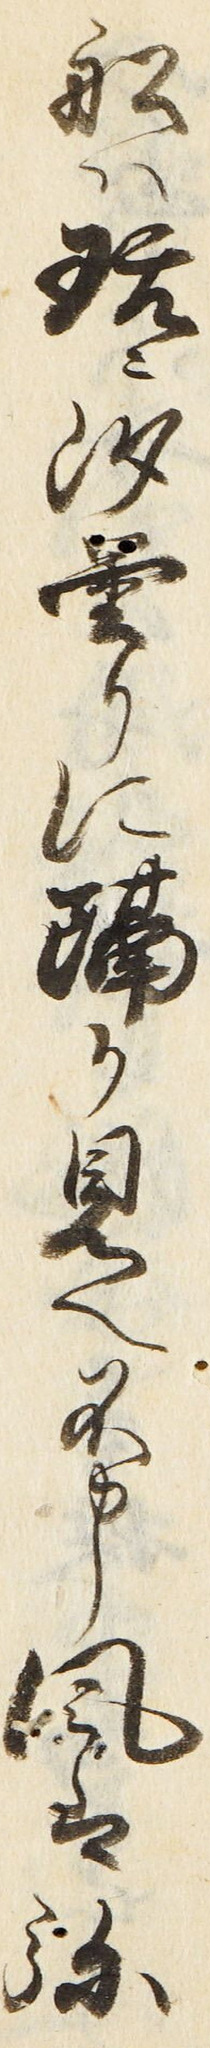舩は既ニ汐曇りに隔り見へ不申風者弥
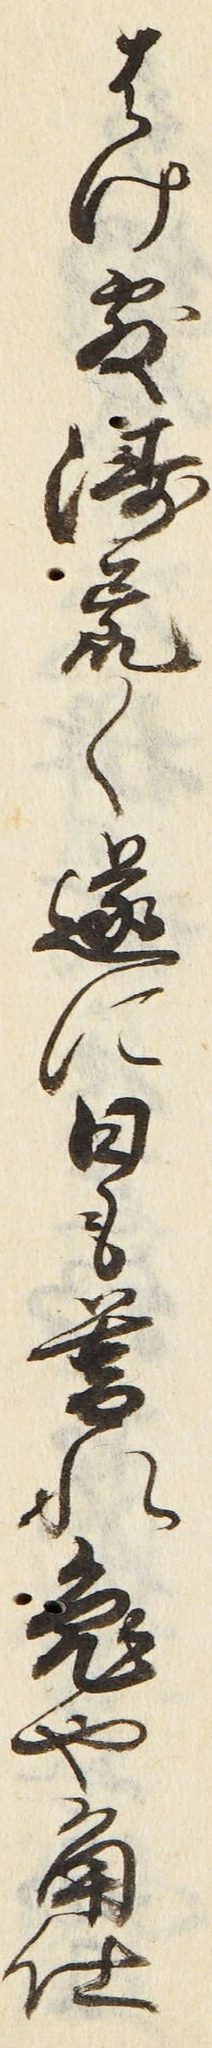はけ敷涛荒く遂に日も暮れ兎や角仕
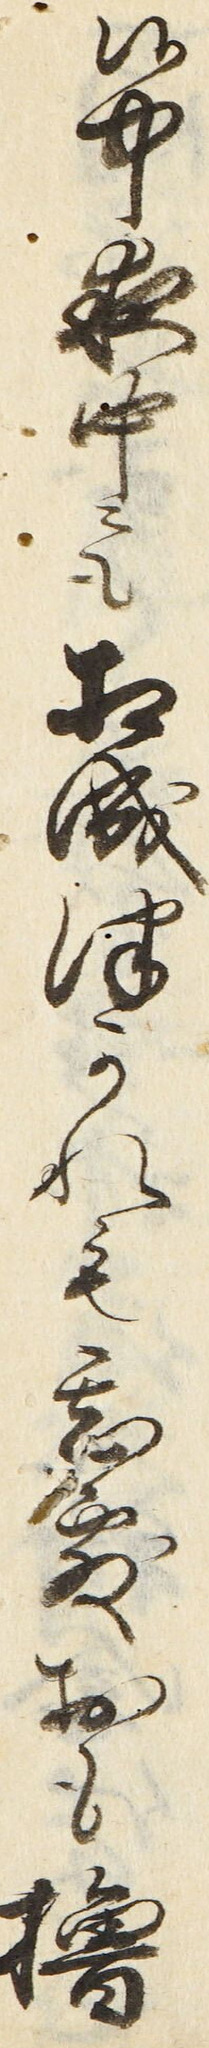候中夜中ニも相成つかれも甚敷おも櫓
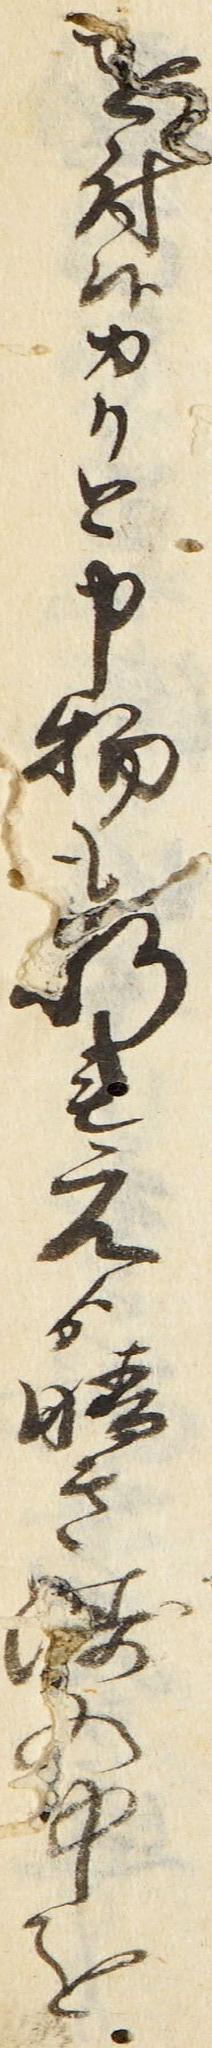を付候カクと申物も折れ元ゟ暗き涛の中を

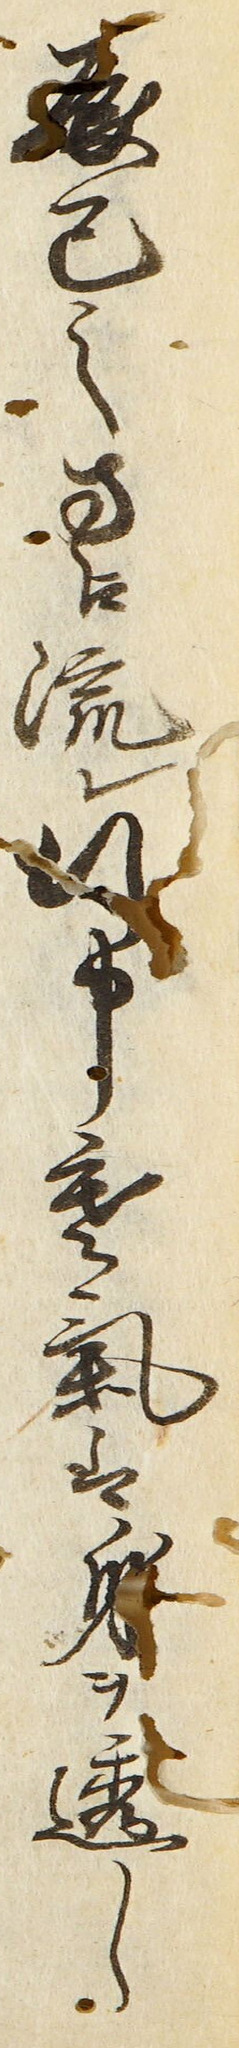辰巳之方江流レ行申寒風は身ヲ透し
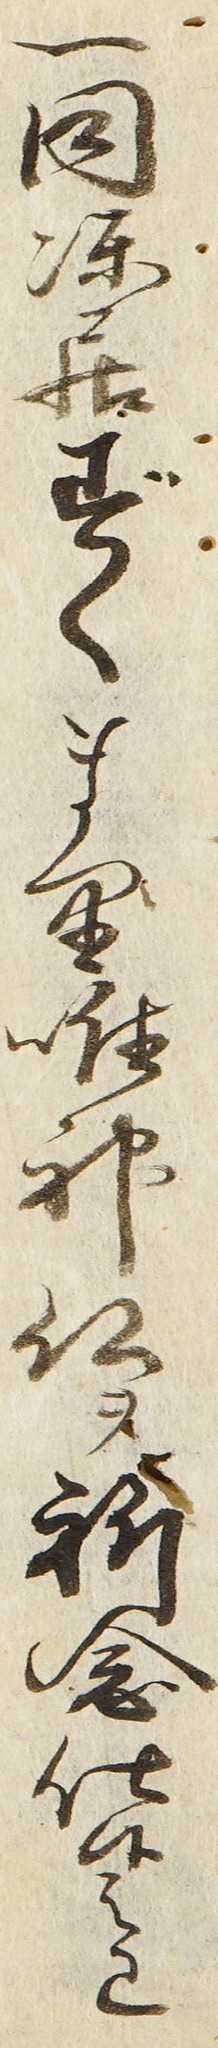一同凍居ずくまり唯神仏ヲ祈念仕候之み
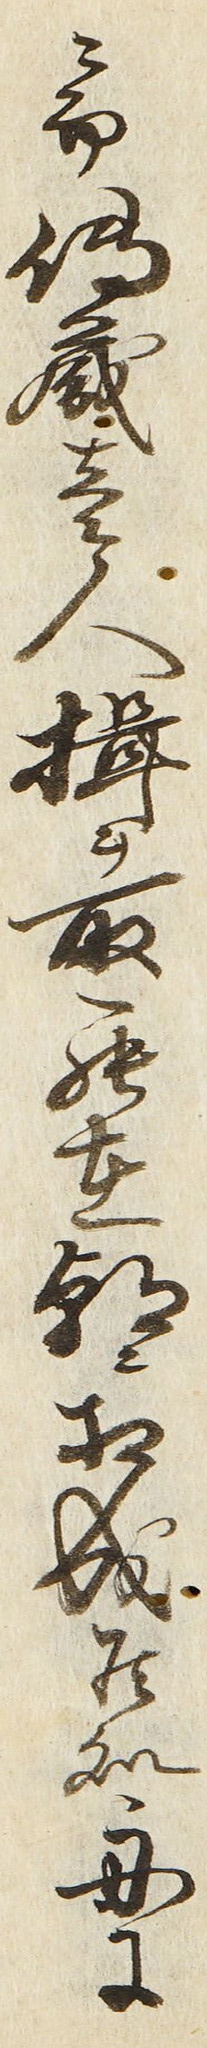ニ而傳蔵壱人楫ヲ取罷在朝ニ相成候処舟に
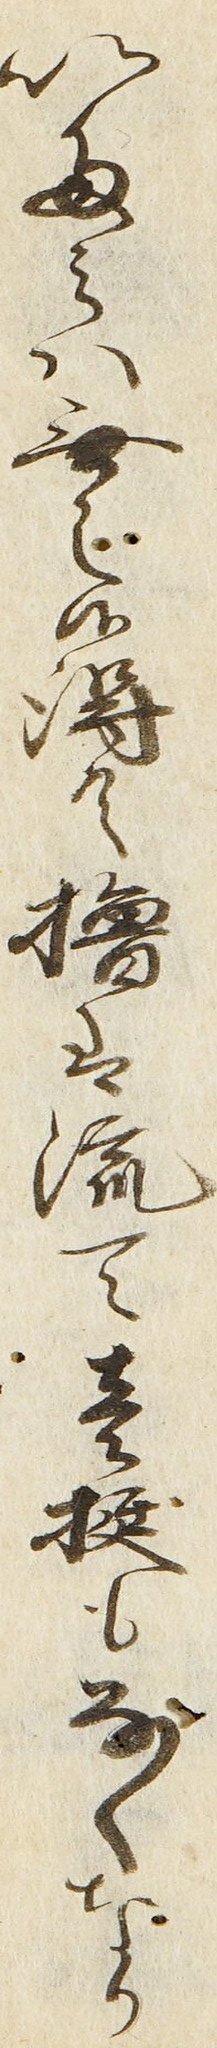いたみハ無之候得共櫓は流て壱挺もなくなり
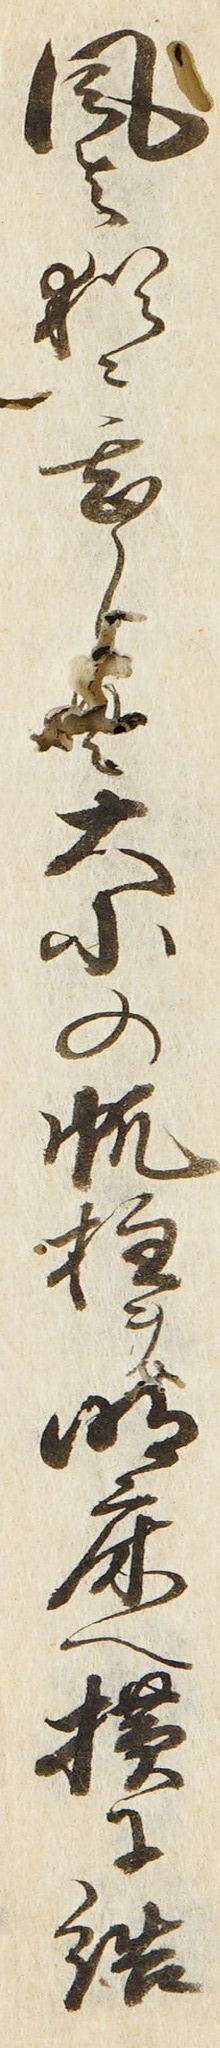風者猶々甚しく大小の帆柱ヲ明床へ横に詰
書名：漂客談寄
